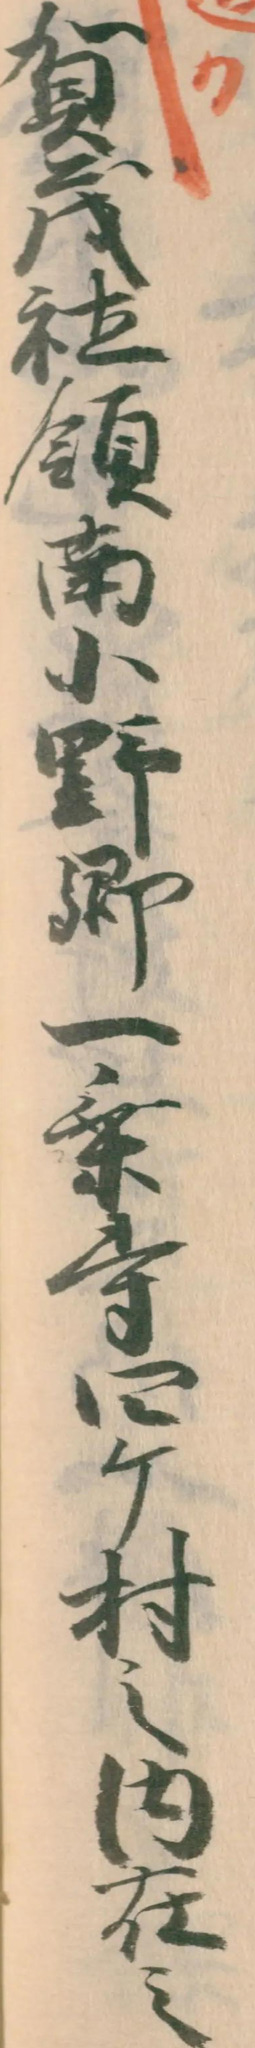賀茂社領南小野郷一乗寺四ヶ村之内在之
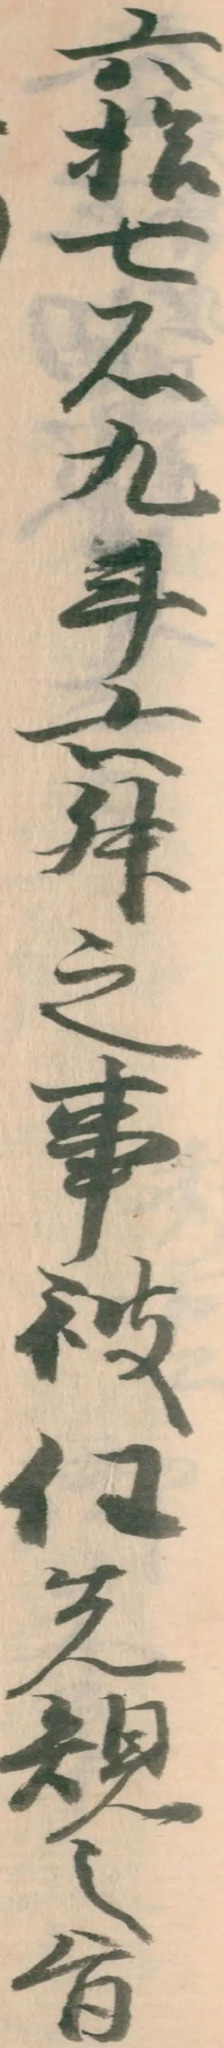六拾七石九斗六升之事被任先規之旨
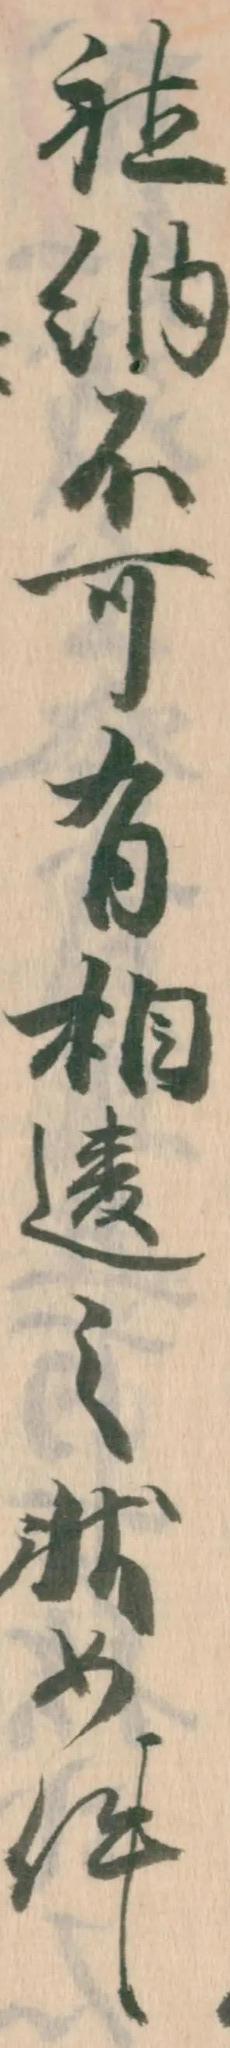社納不可有相違之状如件
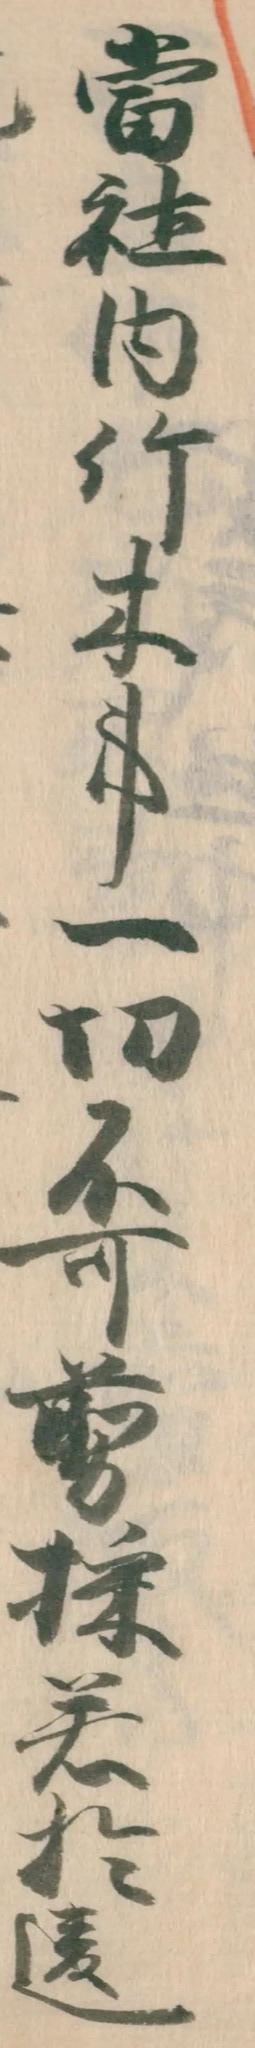当社内竹木事一切不可剪採若於違
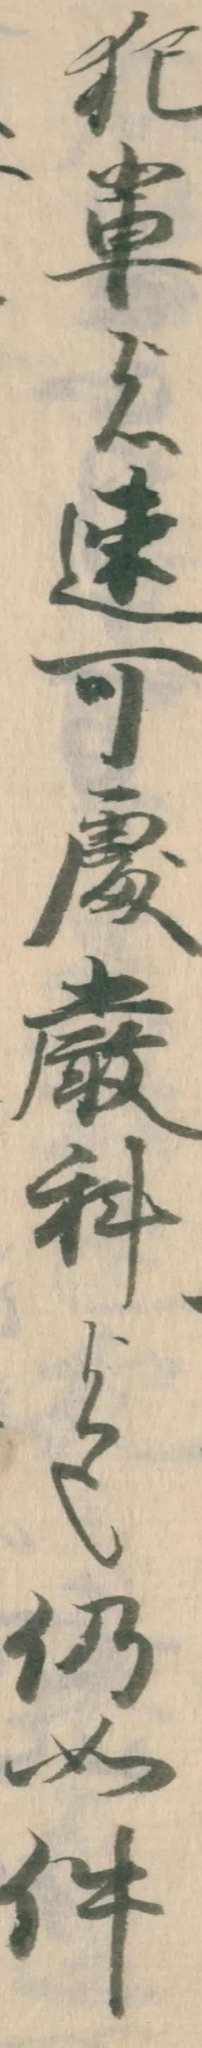犯輩者速可処厳科者也仍如件
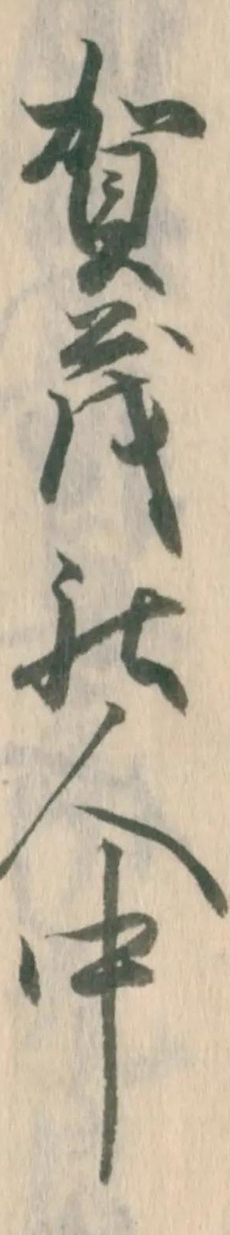賀茂社人中
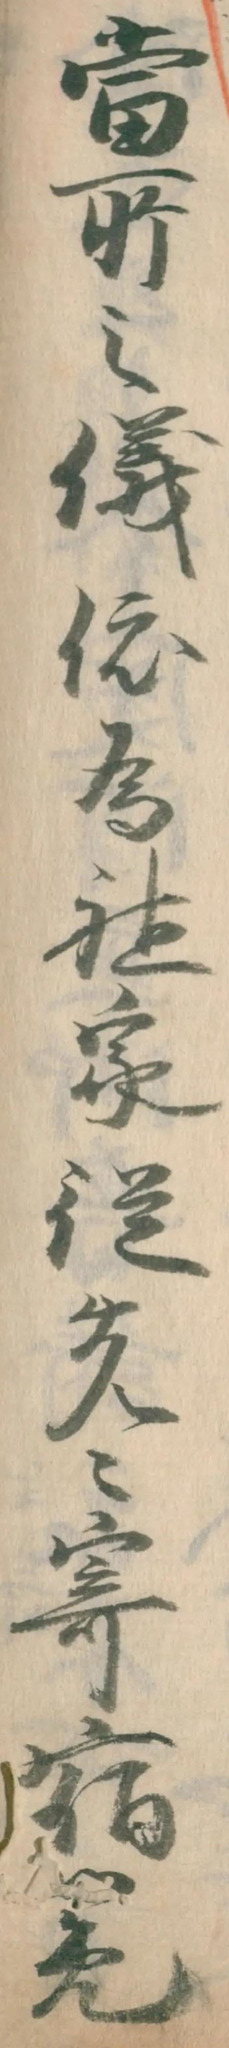当所之儀依為社家従先々寄宿御免

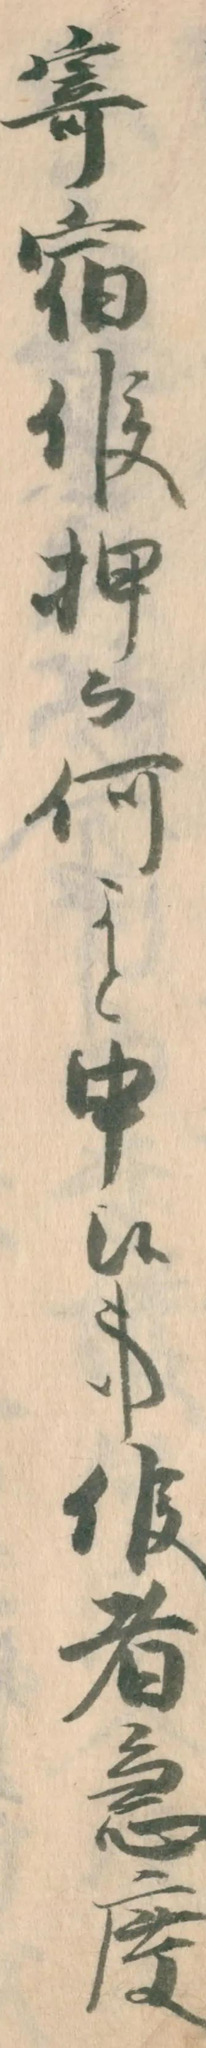寄宿候押而何かと申候事候者急度
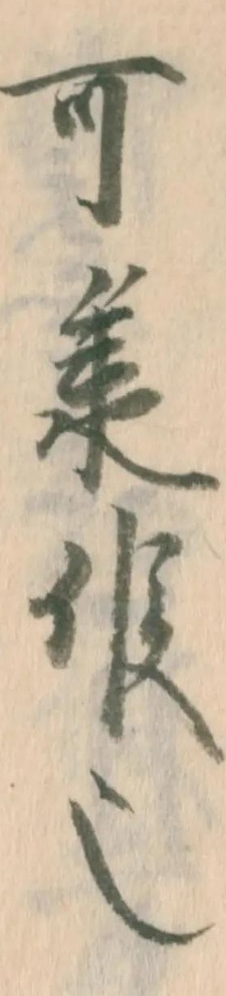可承候也
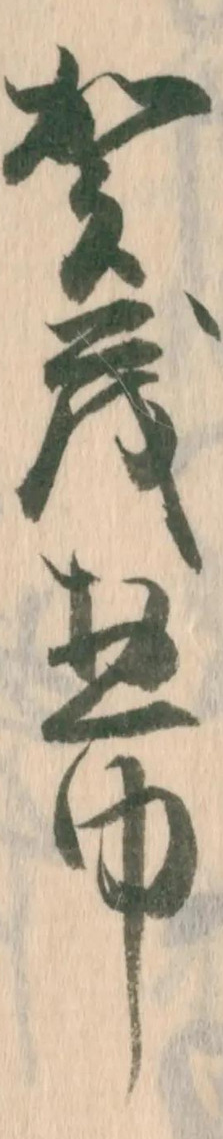賀茂惣中
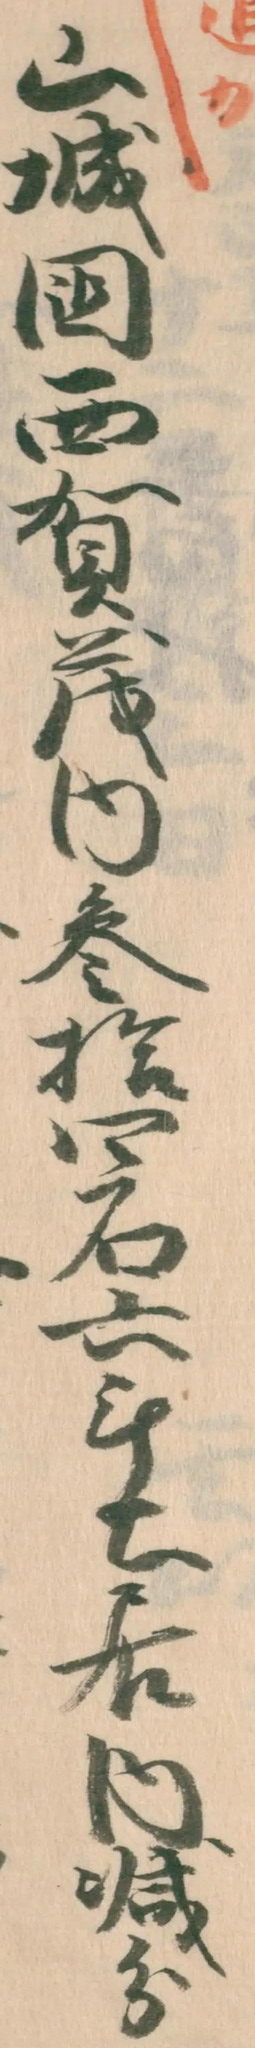山城国西賀茂内参拾四石六斗土居内減分
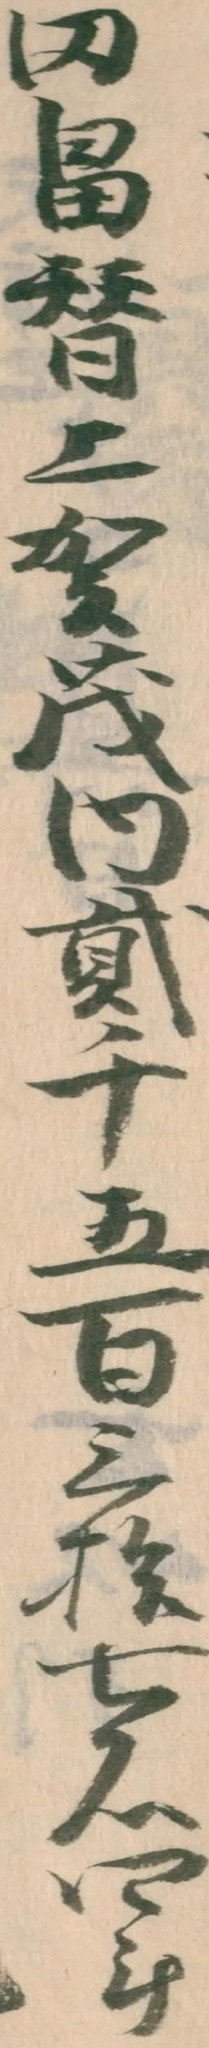田畠替上賀茂内弐千五百三拾七石四斗
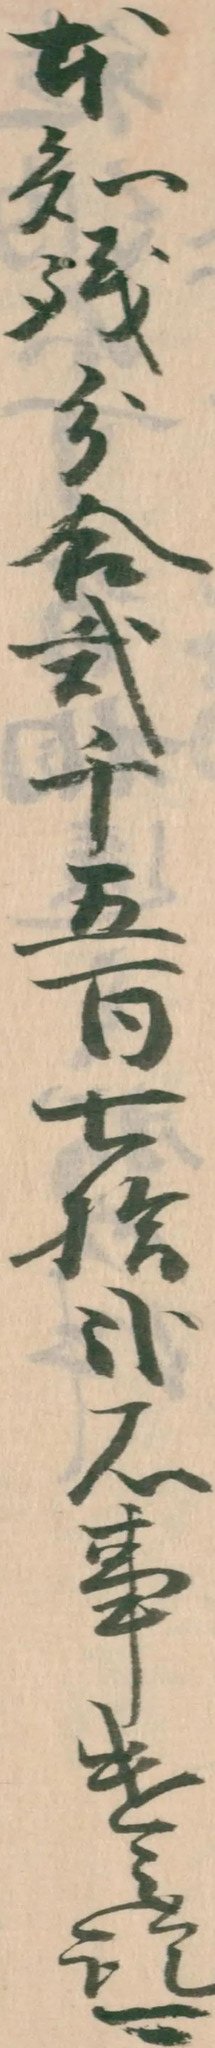本知残分合弐千五百七拾弐石事遣之訖可
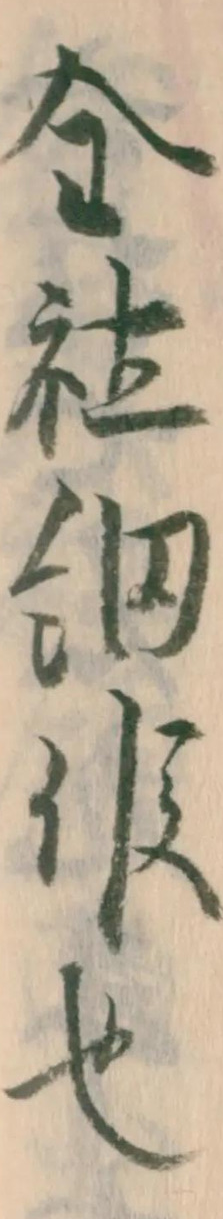全社納候也
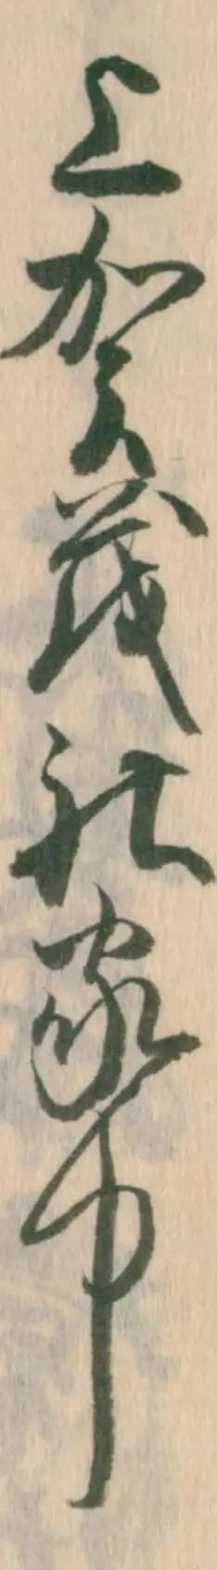上賀茂社家中
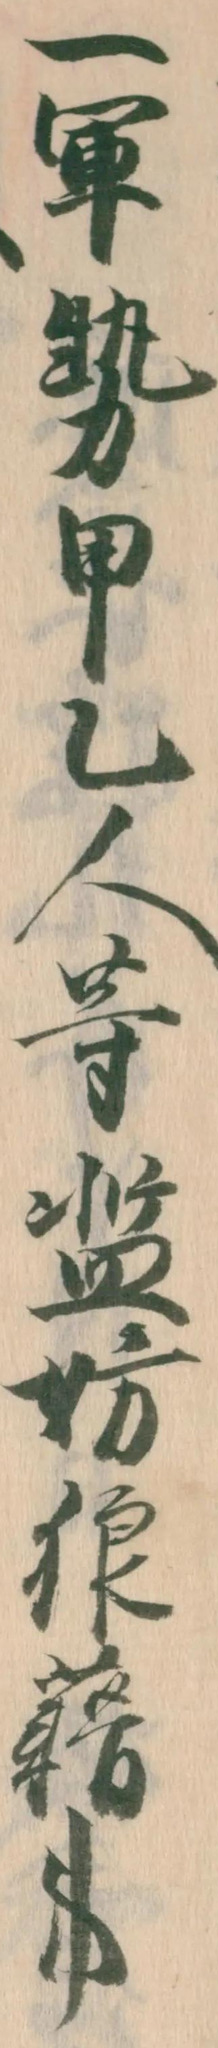一軍勢甲乙人等濫妨狼藉事
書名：賀茂社記録. 第1冊
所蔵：国立国会図書館 National Diet Library, JAPAN
